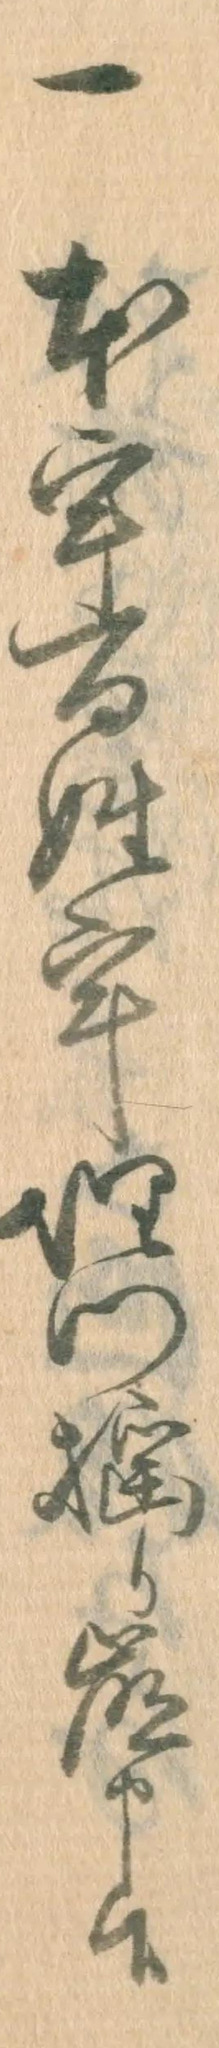一本牢百姓牢埋門揺り崩申候
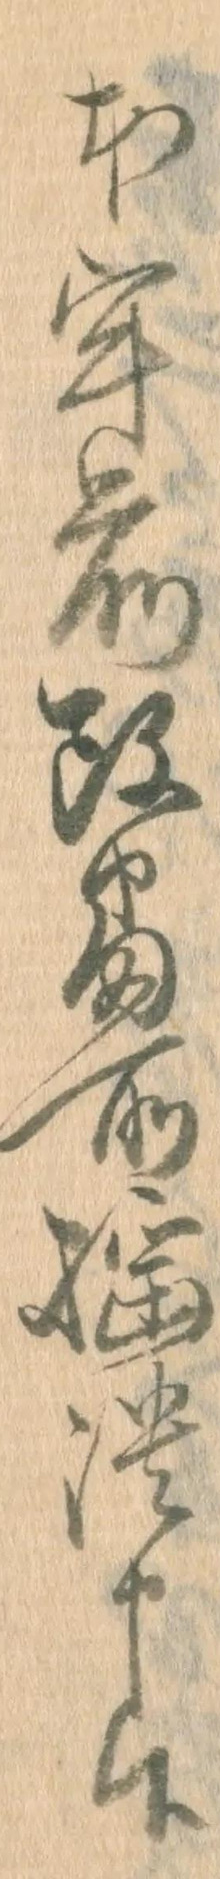一本牢前改番所揺潰申候
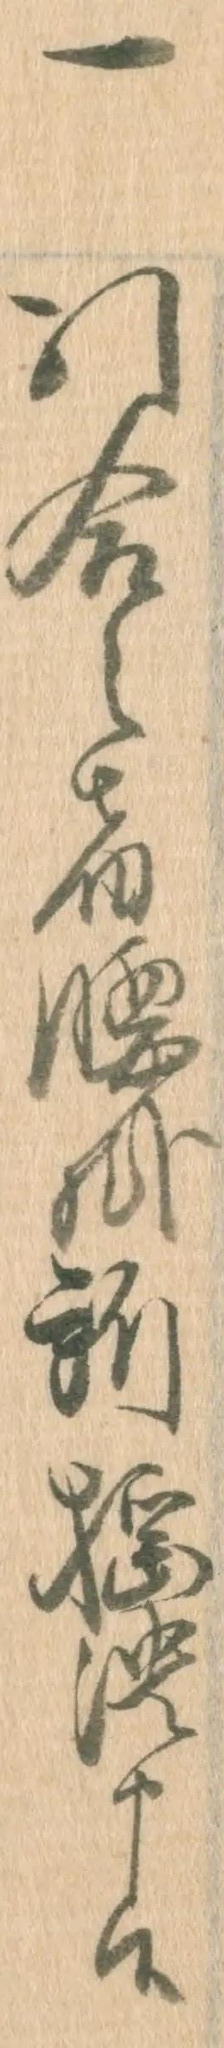一引合之者腰掛所揺潰申候
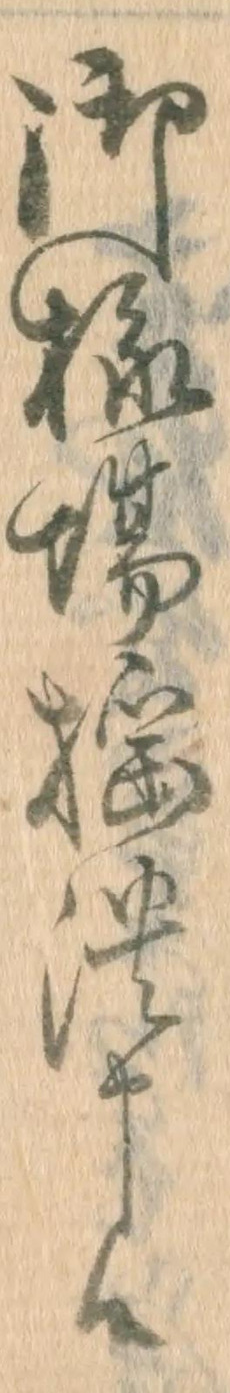一御様場揺潰申候
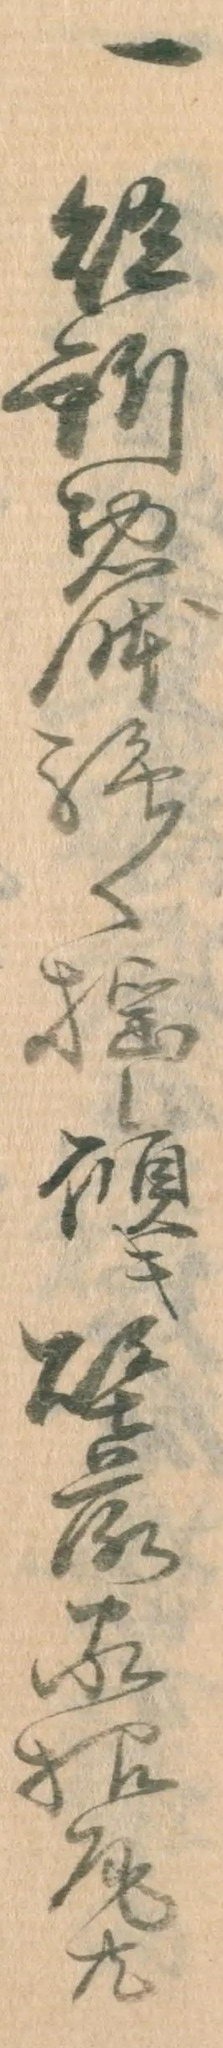一賄所惣体強く揺レ傾キ壁崩家根瓦共┏下
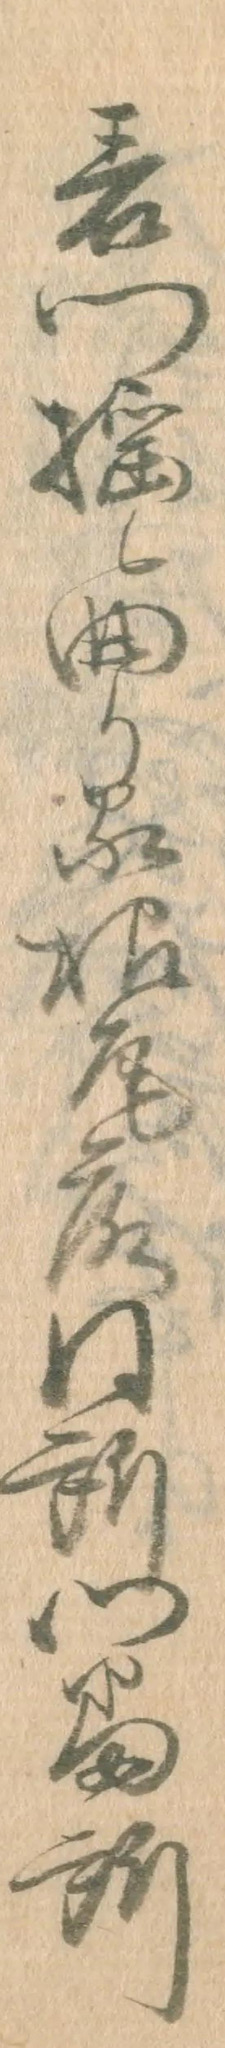一表門揺レ曲り家根瓦落同所御番所
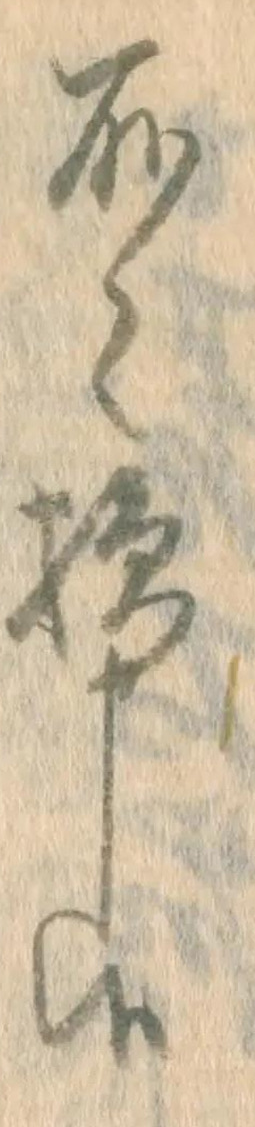所〻損申候
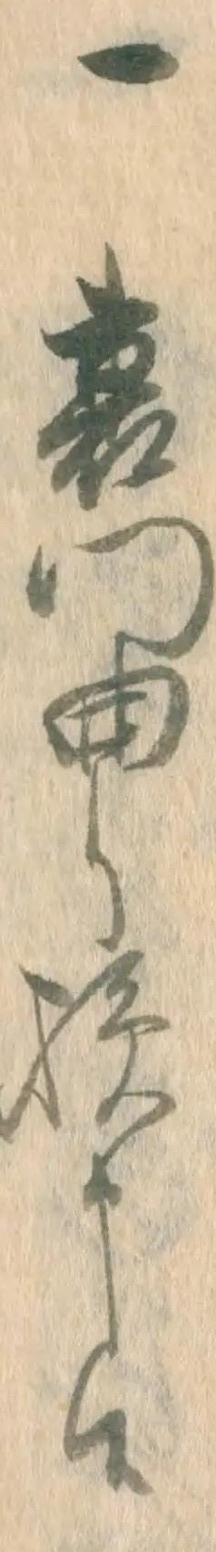一裏門曲り損申候

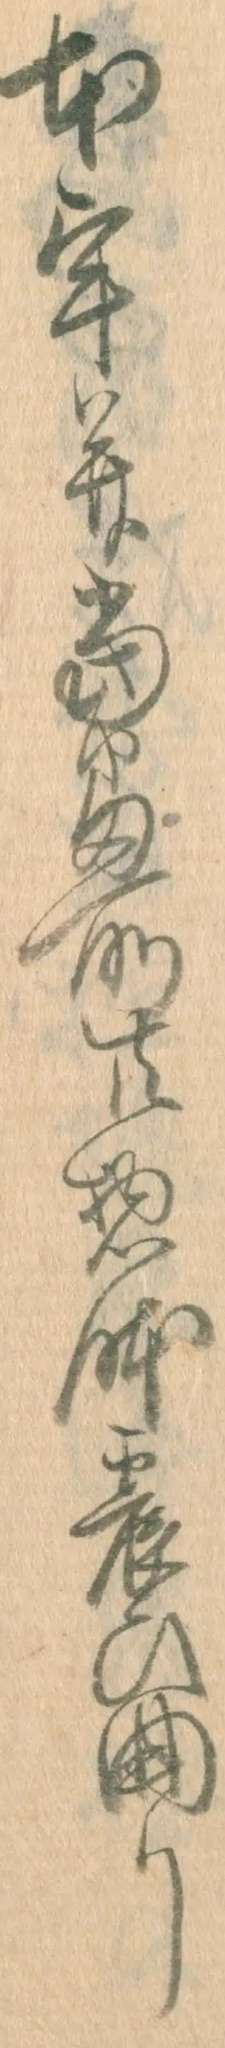一本牢幷当番所共惣体震ひ曲り
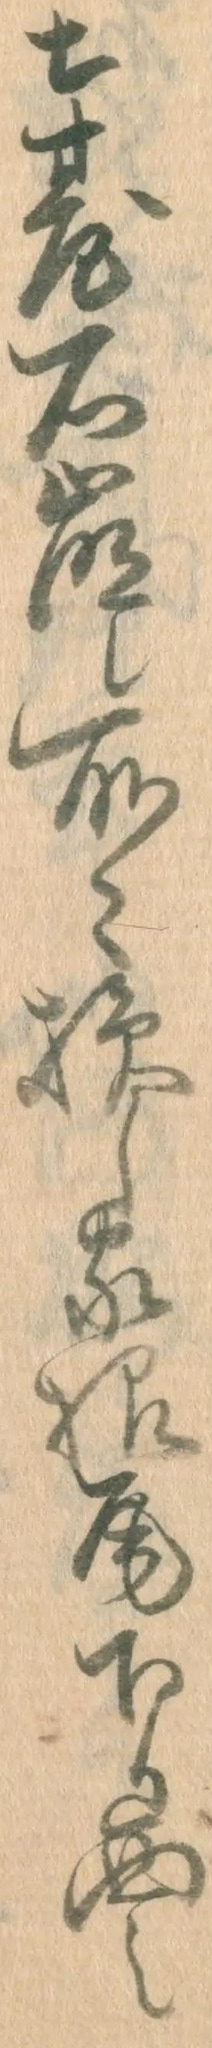土台石崩レ所〻損し家根瓦下り西之
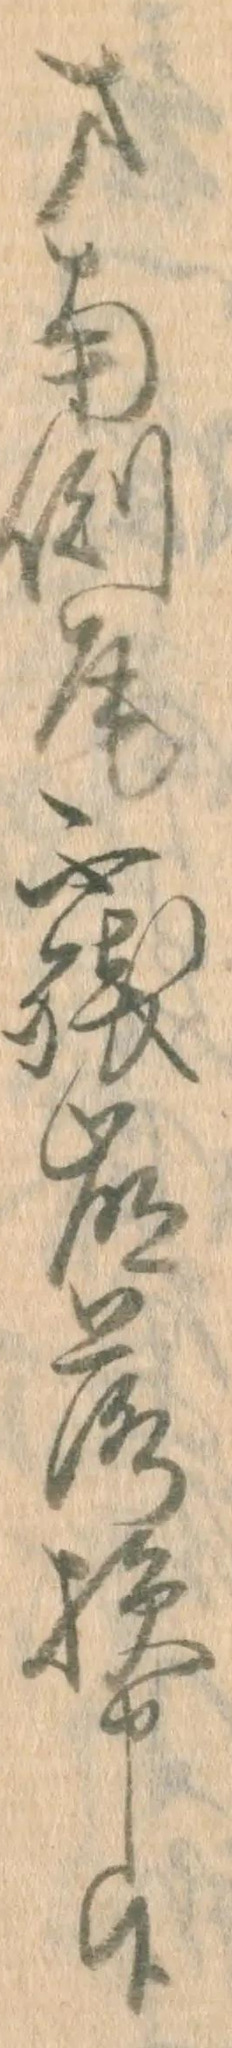方南側瓦不残崩落損申候
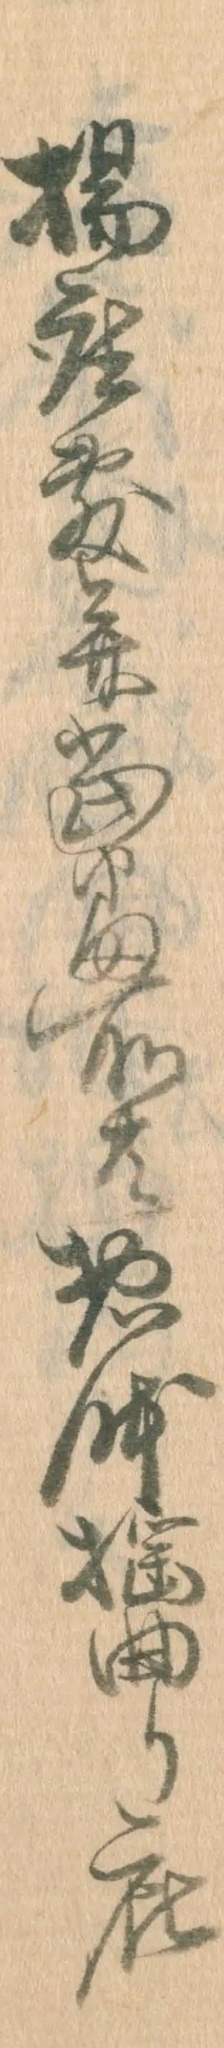一揚座敷幷当番所共惣体揺曲り庇
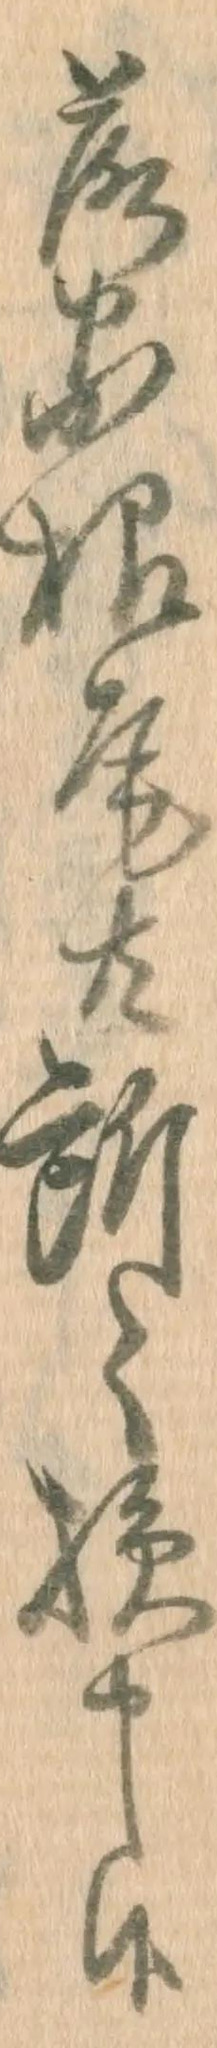落家根瓦共所〻損申候
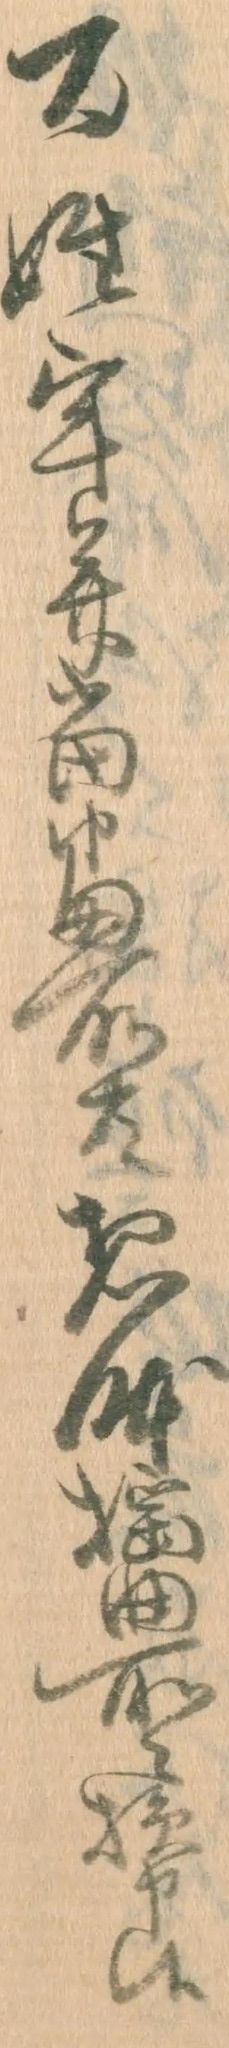一百姓牢幷当番所共惣体揺曲所〻損申候
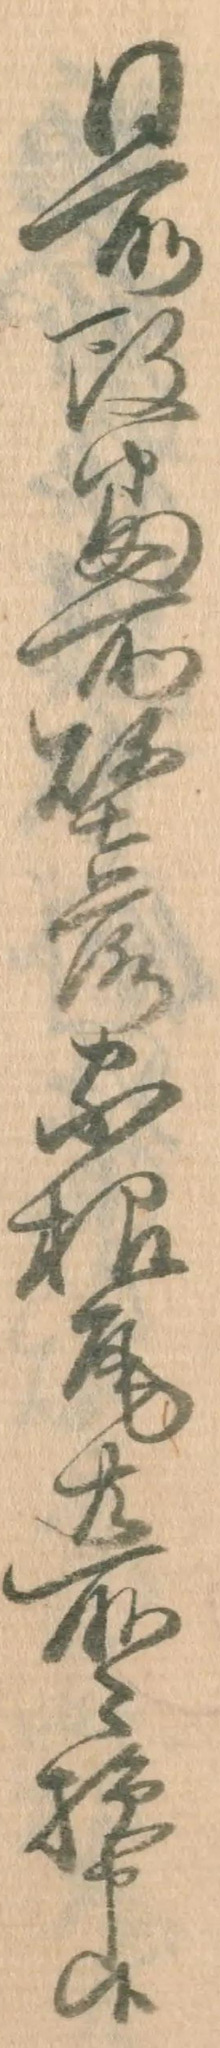一同所改番所壁落家根瓦共所〻損申候
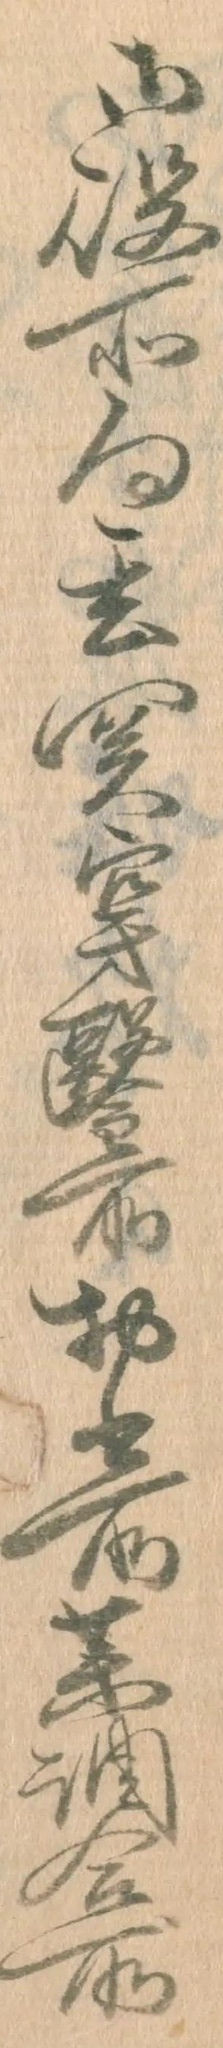一御役所向玄関穿鑿所物書所薬調合所
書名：七十冊物類集 71巻. [44] 四十三 牢屋敷御普請御修覆地震ニ付骨折候牢屋掛御褒美之部
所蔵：国立国会図書館 National Diet Library, JAPAN
